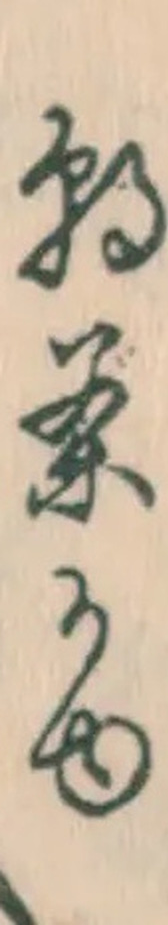朝茶かゆ
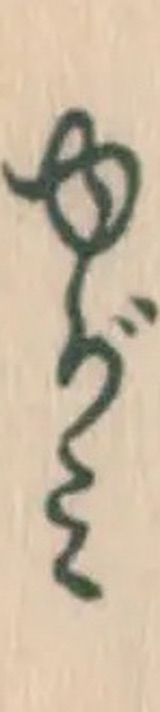ゆがみ
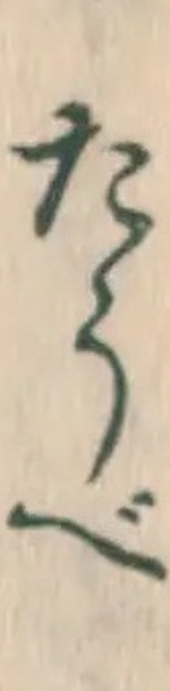たうべ
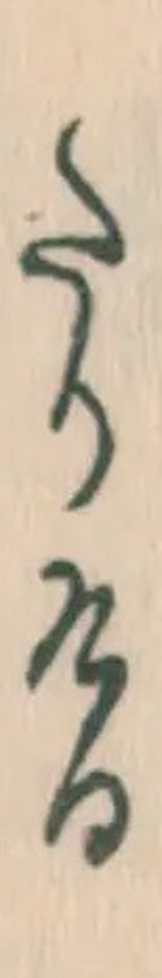たりける

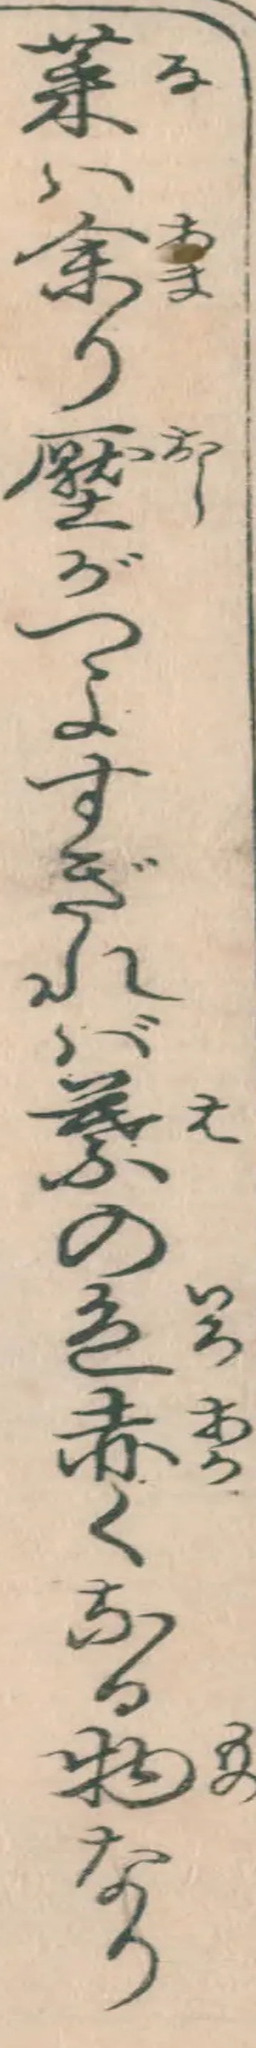菜は余り圧がつよすぎれば葉の色赤くなる物なり
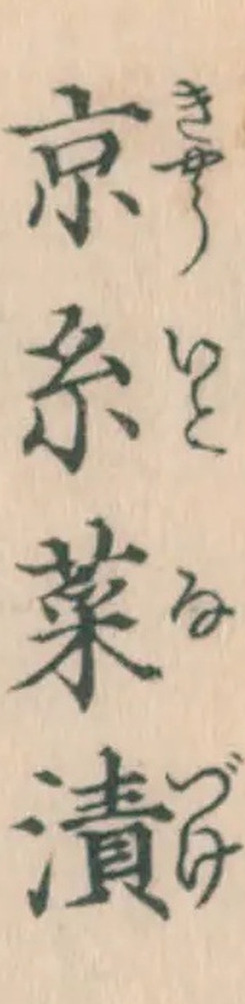京糸菜漬
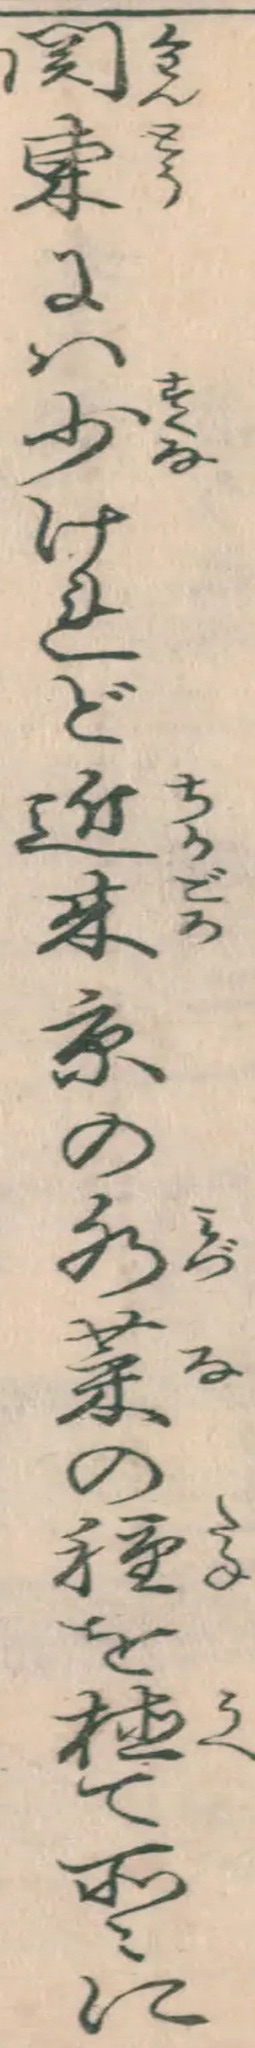関東には少けれど近来京の水菜の種を植て所々に
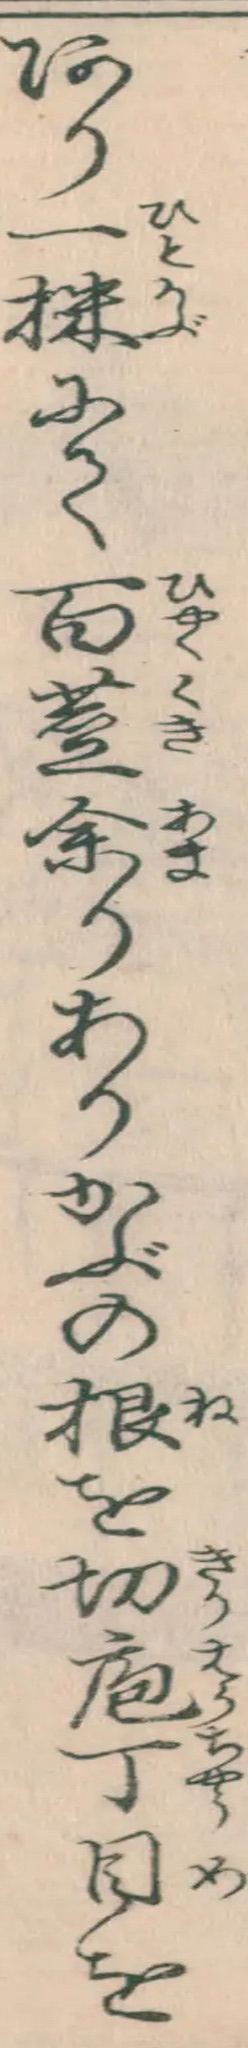あり一株にて百茎余りありかぶの根を切庖丁目を
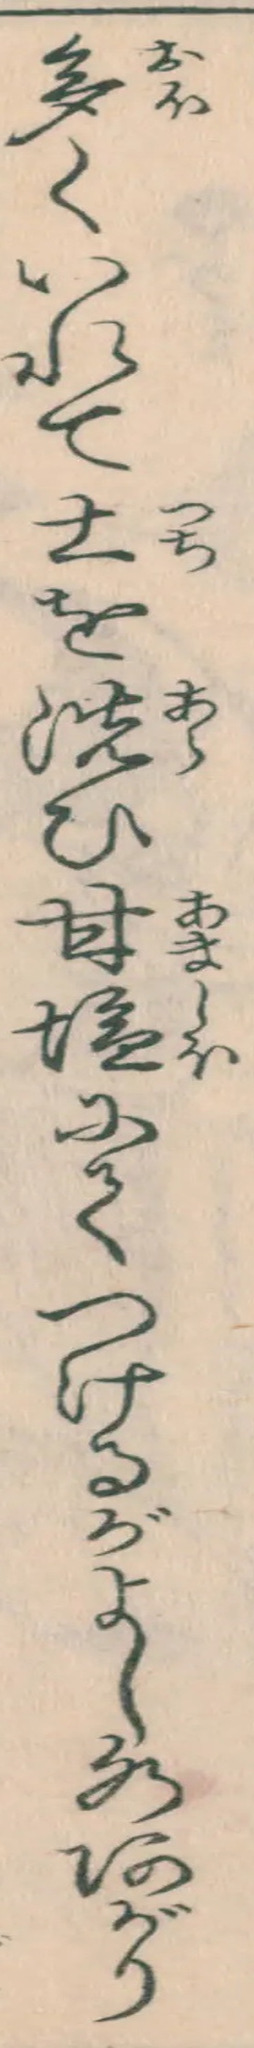多くいれて土を洗ひ甘塩にてつけるがよし水あがり
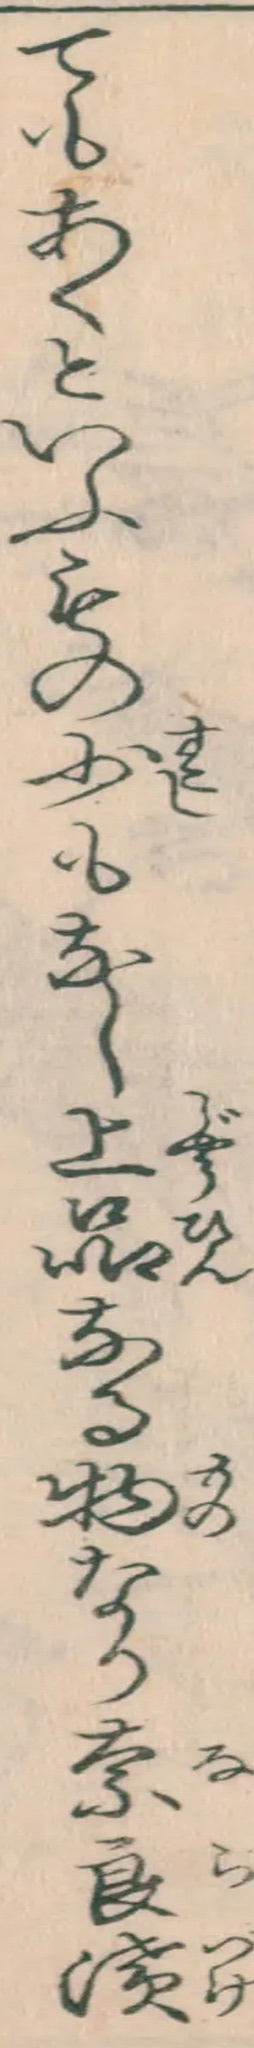てもあくといふもの少もなし上品なる物なり奈良漬
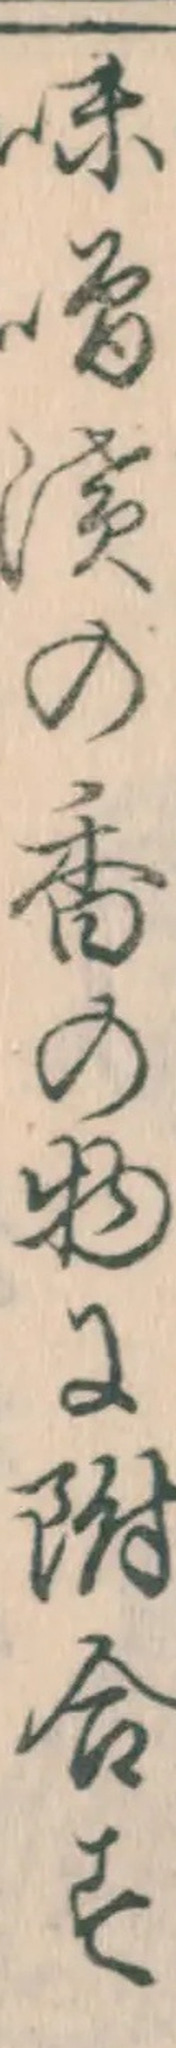味噌漬の香の物に附合す
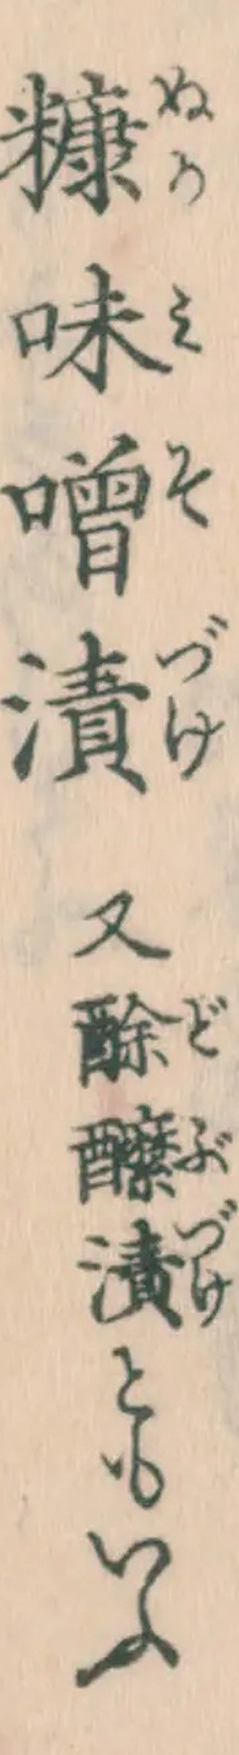糠味噌漬又酴醿漬ともいふ
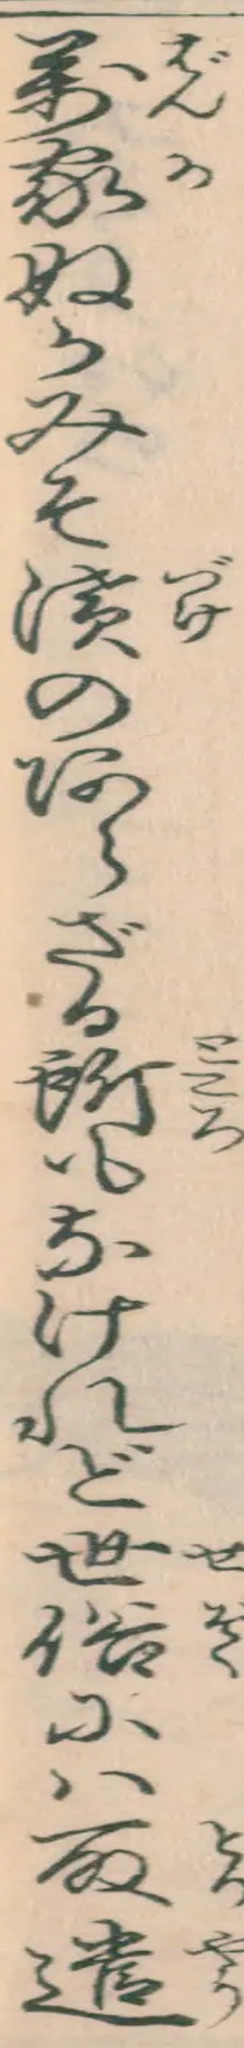万家ぬかみそ漬のあらざる所もなけれど世俗には取遣
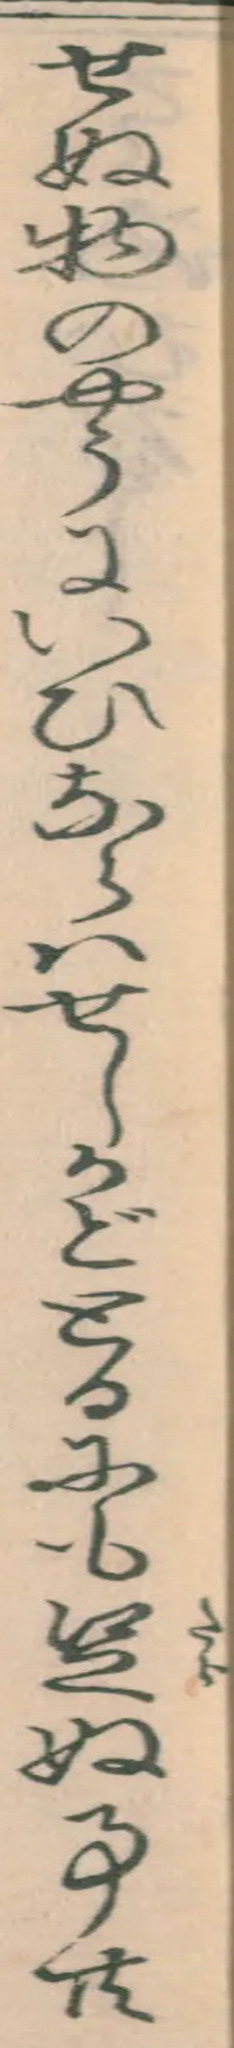せぬ物のやうにいひならはせしかどとるにも足ぬ事共
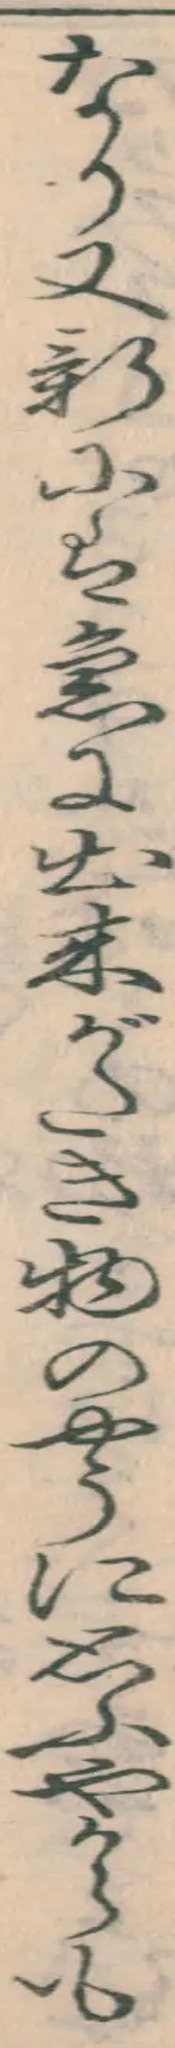なり又新には急に出来がたき物のやうに思ふやからも
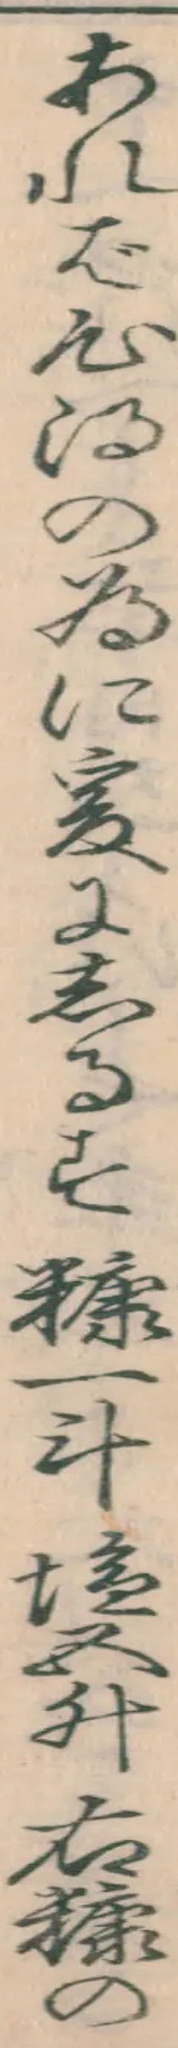あれば心得の為に爰にしるす糠一斗塩五升右糠の
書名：四季漬物鹽嘉言
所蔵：国立国会図書館 National Diet Library, JAPAN
